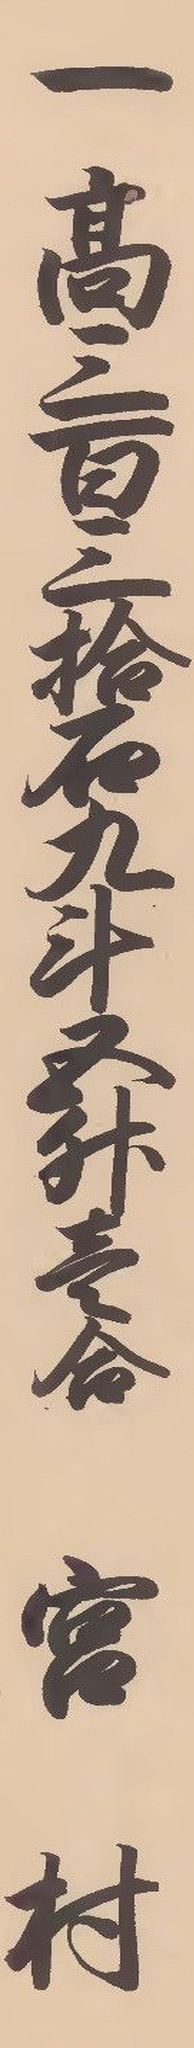一高三百三拾石九斗五升壱合宮村
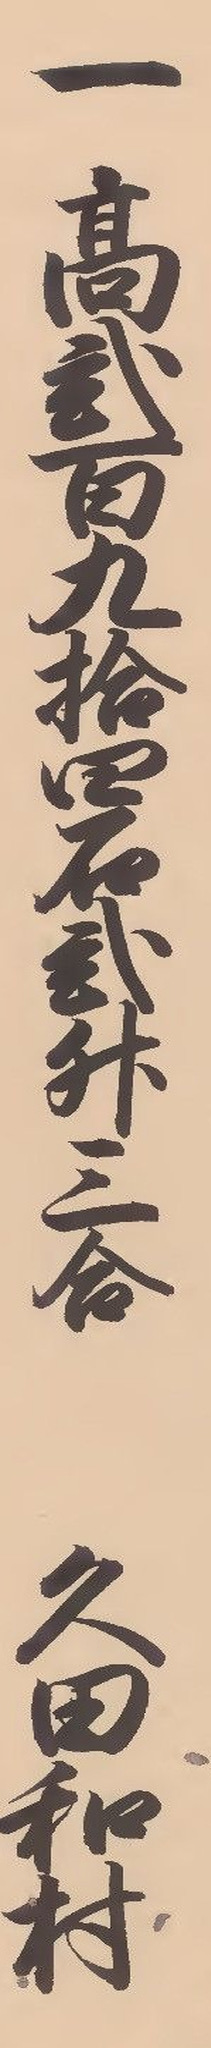一高弐百九拾四石弐升三合久田和村
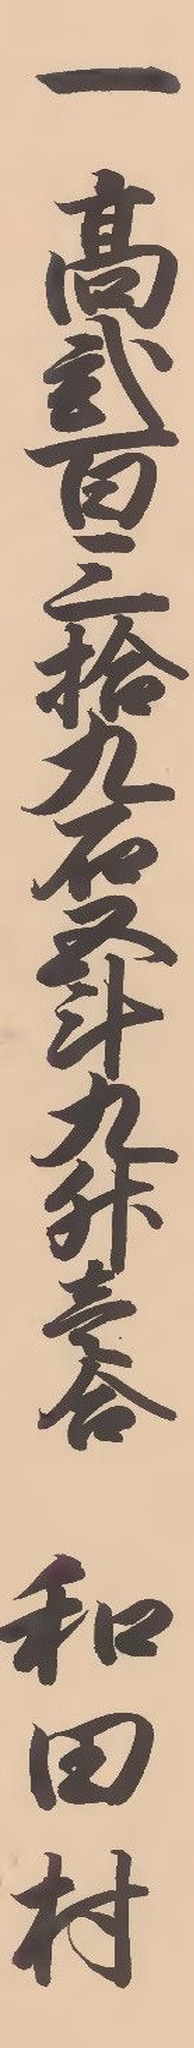一高弐百三拾九石五斗九升壱合和田村
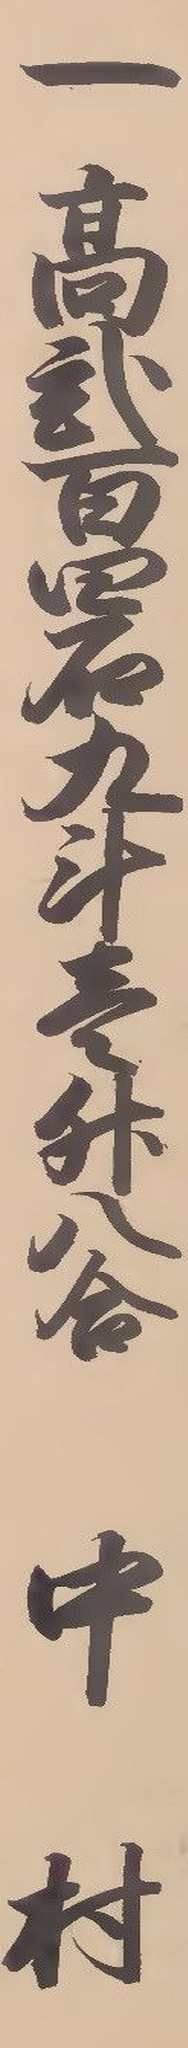一高弐百四石九斗壱升八合中村
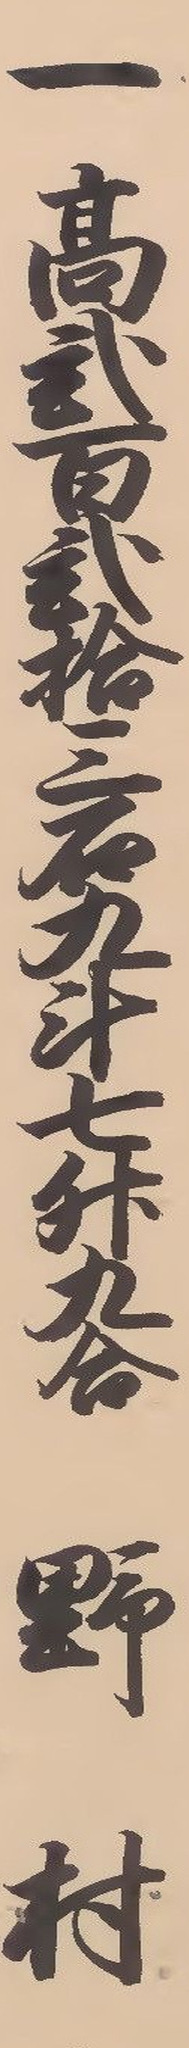一高弐百弐拾三石九斗七升九合野村
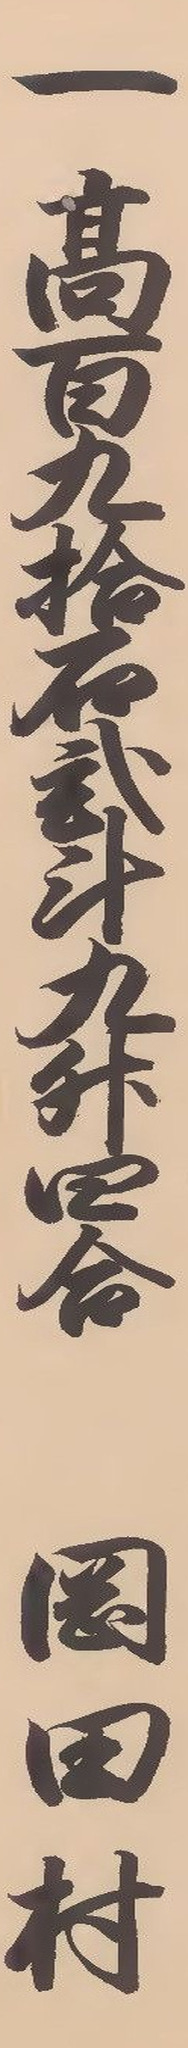一高百九拾石弐斗九升四合岡田村
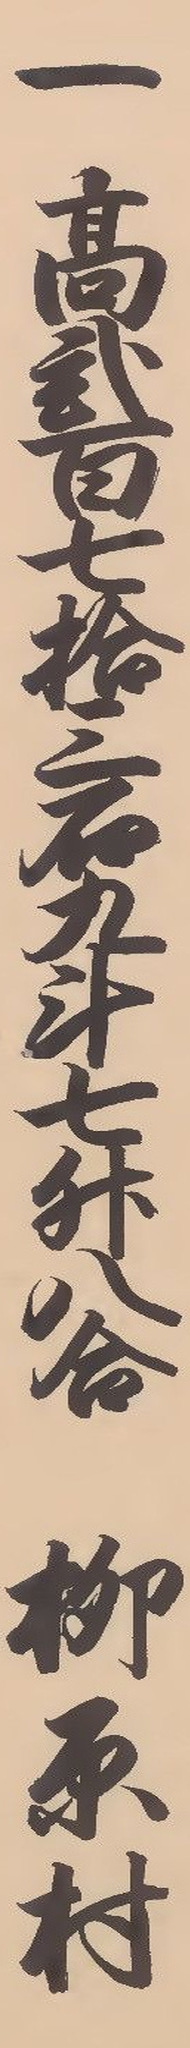一高弐百七拾三石九斗七升八合柳原村

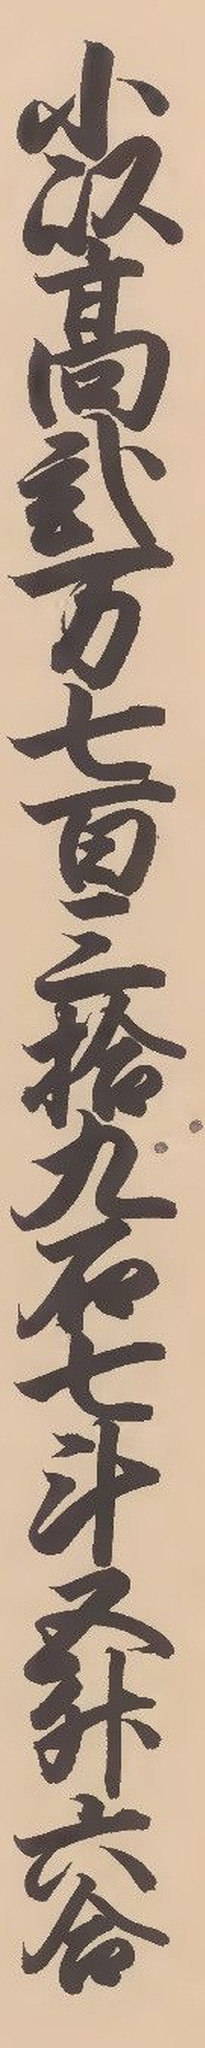小以高弐万七百三拾九石七斗五升六合
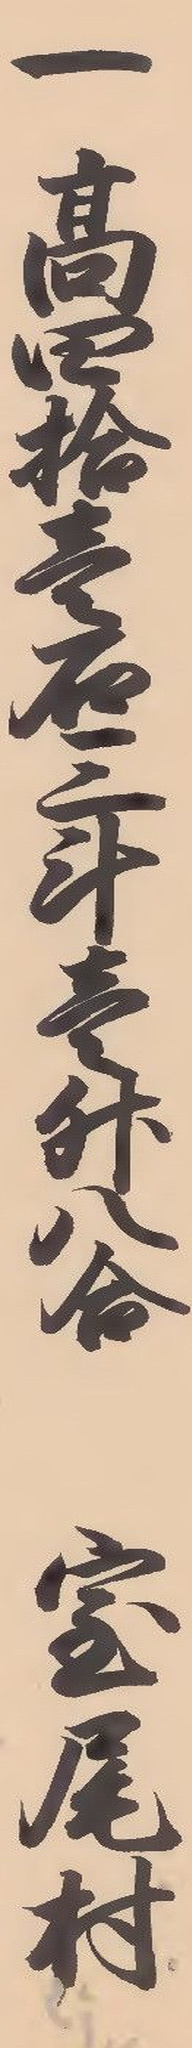一高四拾壱石三斗壱升八合室尾村
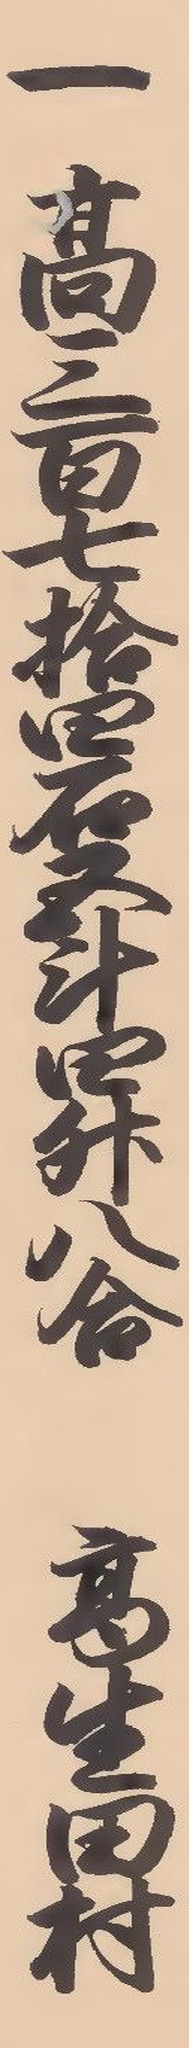一高三百七拾四石五斗四升八合高生田村
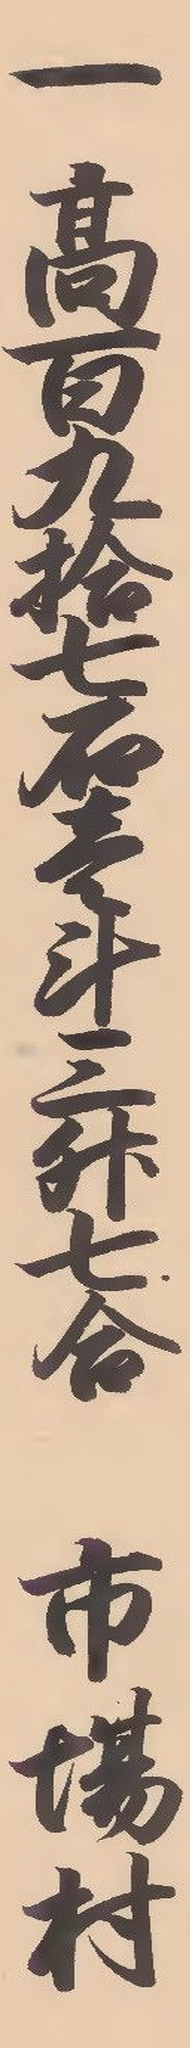一高百九拾七石壱斗三升七合市場村

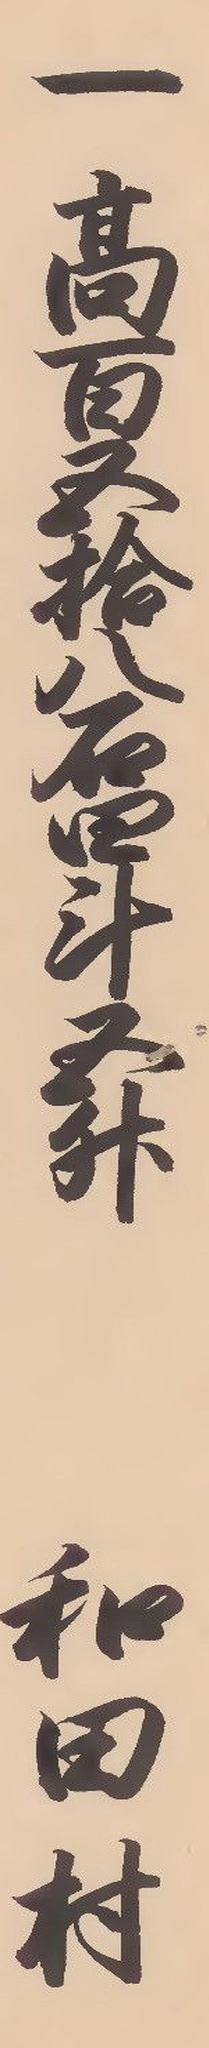一高百五拾八石四斗五升和田村
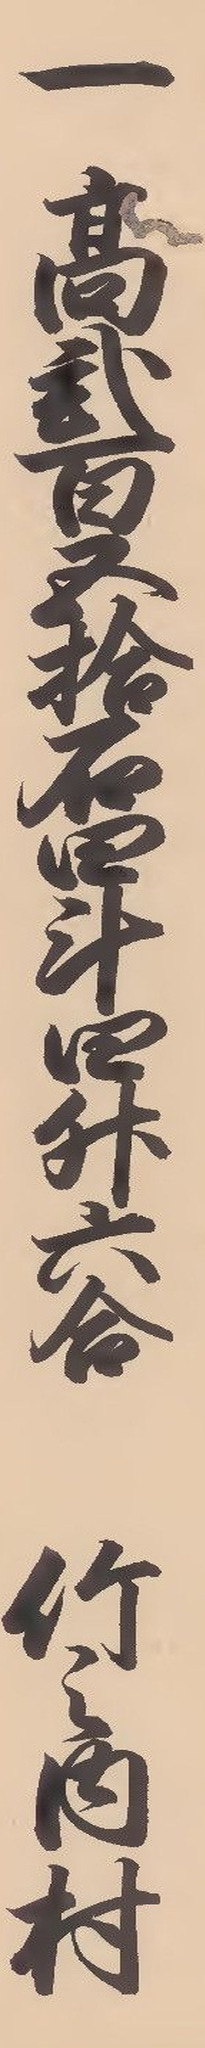一高弐百五拾石四斗四升六合竹之内村
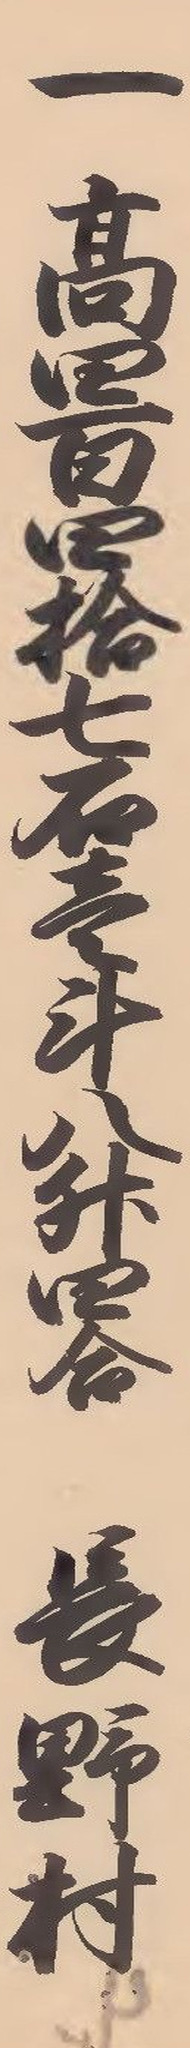一高四百四拾七石壱斗八升四合長野村
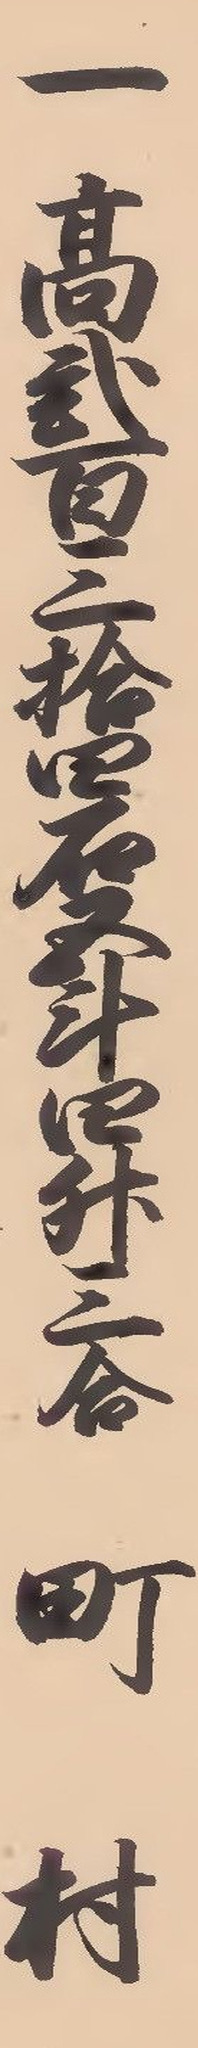一高弐百三拾四石五斗四升三合町村
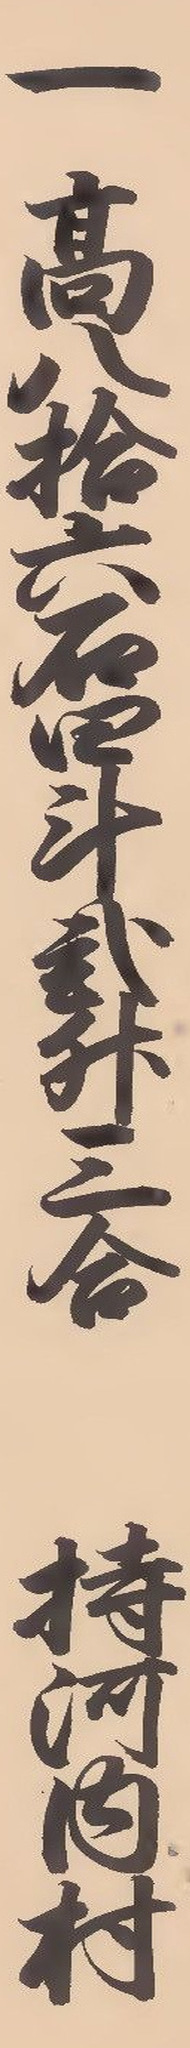一高八拾六石四斗弐升三合持河内村
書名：但馬国郷帳
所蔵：国立公文書館 National Archives of Japan
